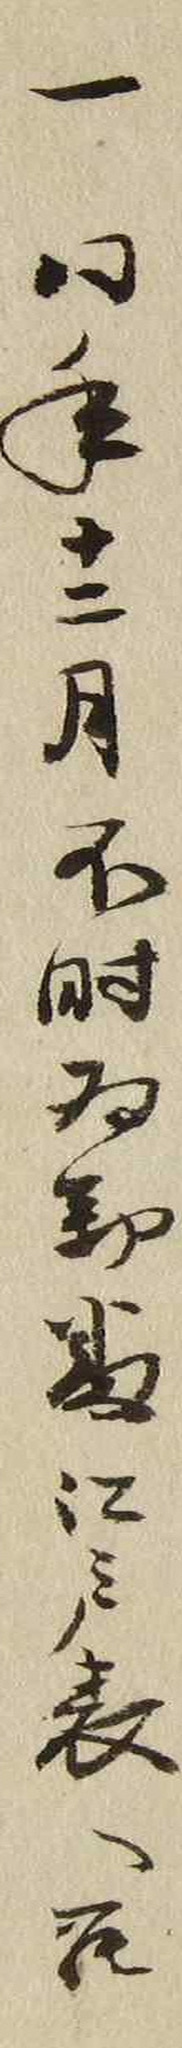一同年十二月不時為勤番江戸表へ罷
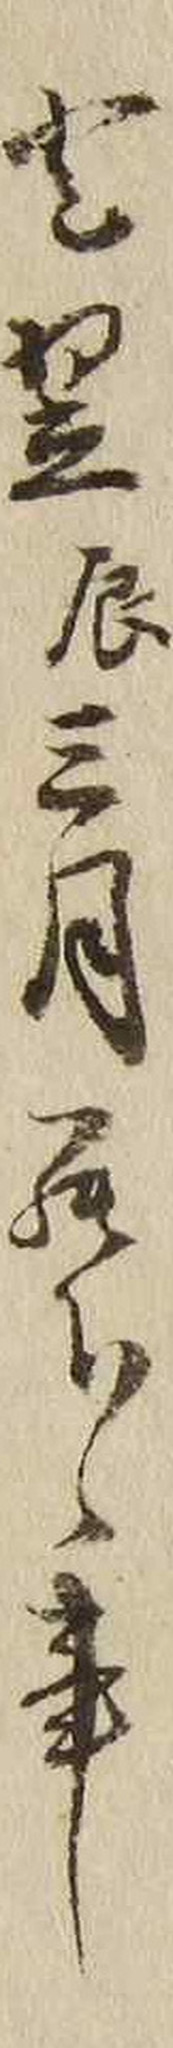登翌辰三月罷下候事
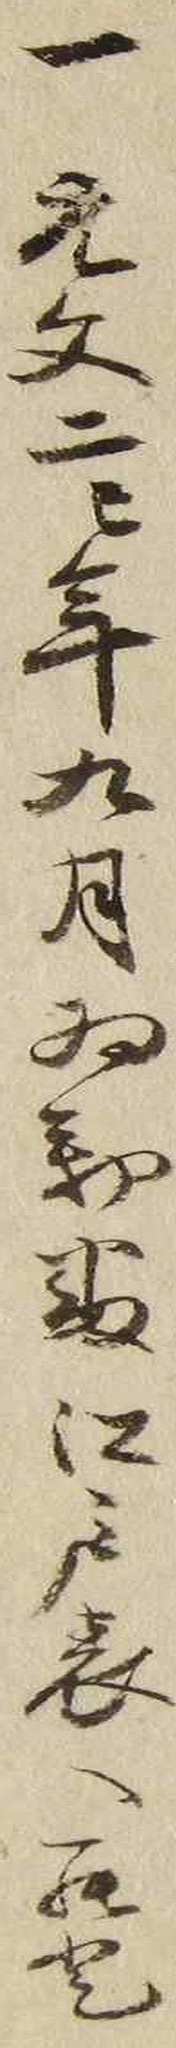一元文二巳年九月為勤番江戸表へ罷登
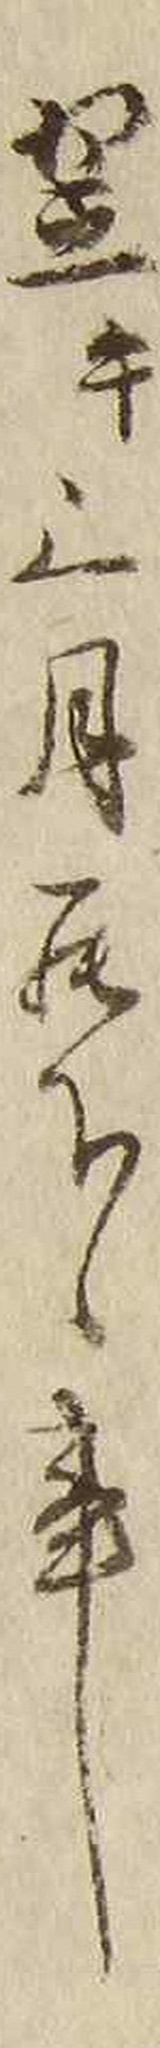翌午三月罷下候事

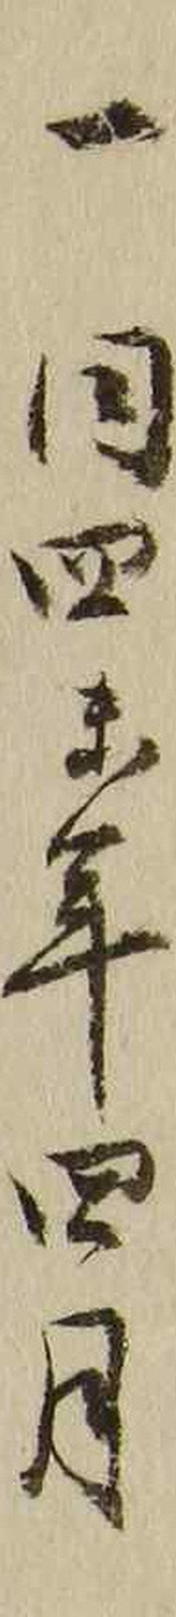一同四未年四月
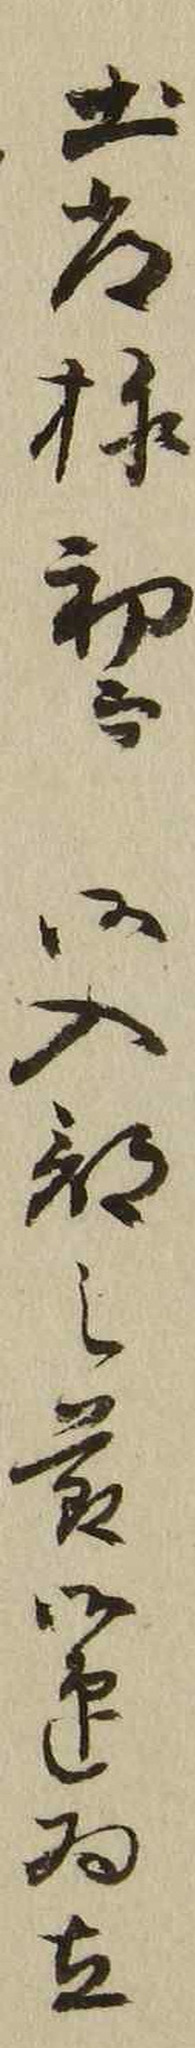土常様初而御入部之節御迎為立
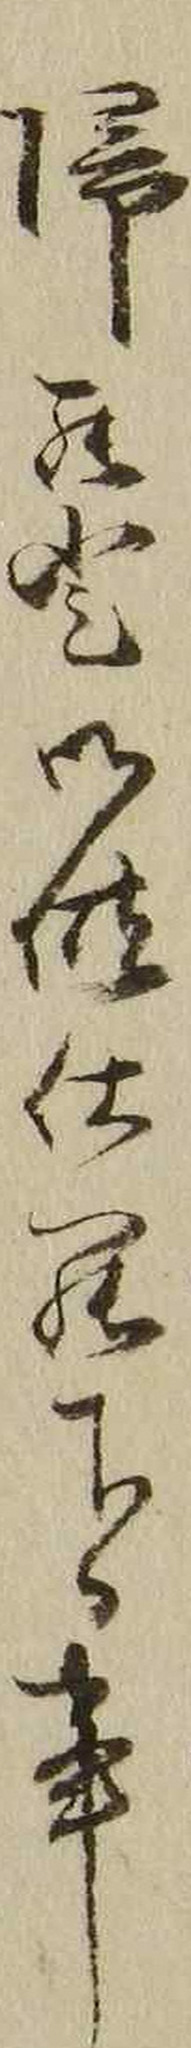帰罷登御供仕罷下候事
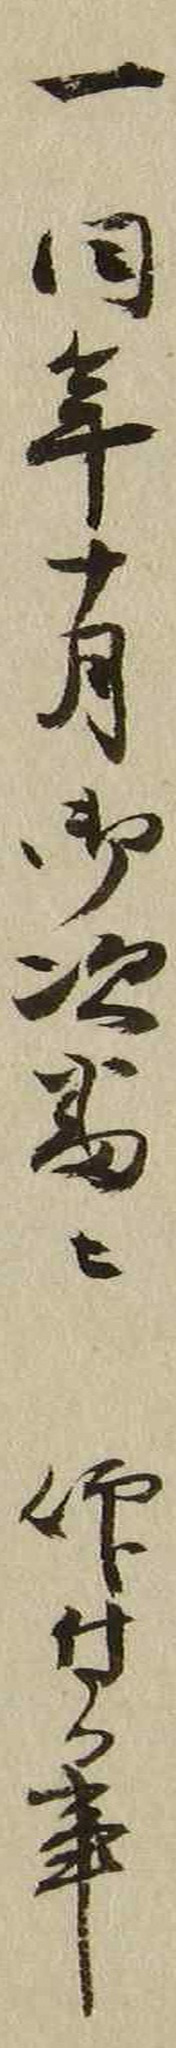一同年十月御次番被仰付候事
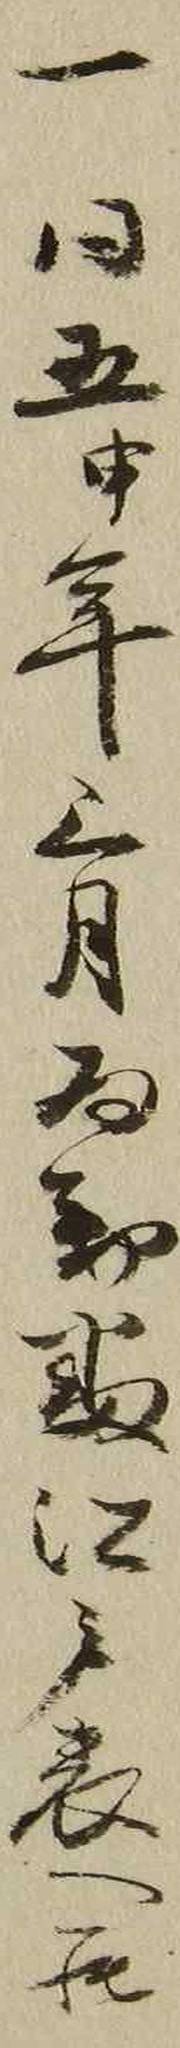一同五申年三月為勤番江戸表へ罷
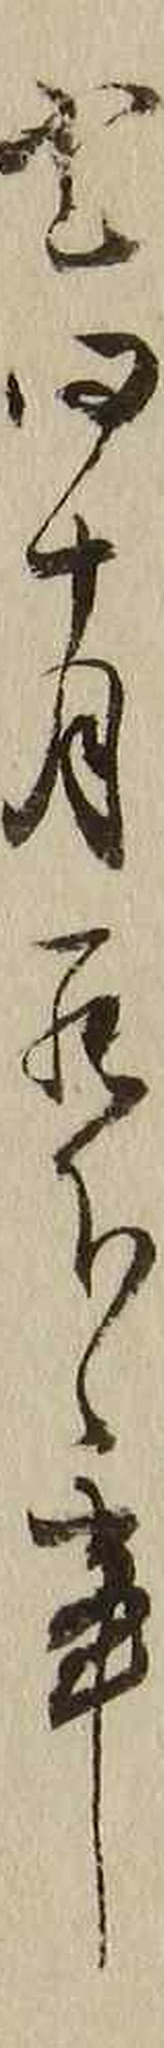登同十月罷下候事
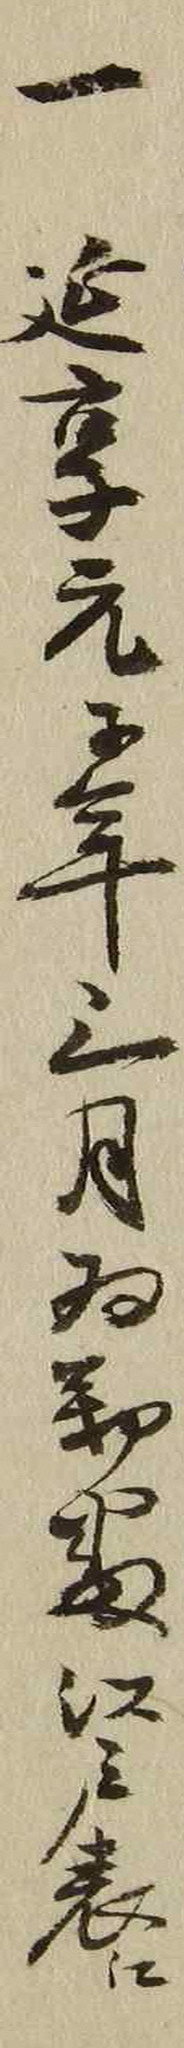一延享元子年三月為勤番江戸表江
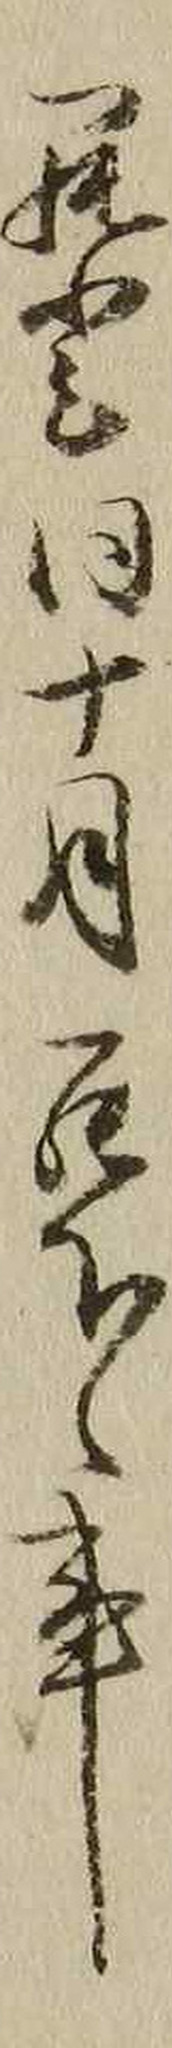罷登同十月罷下候事
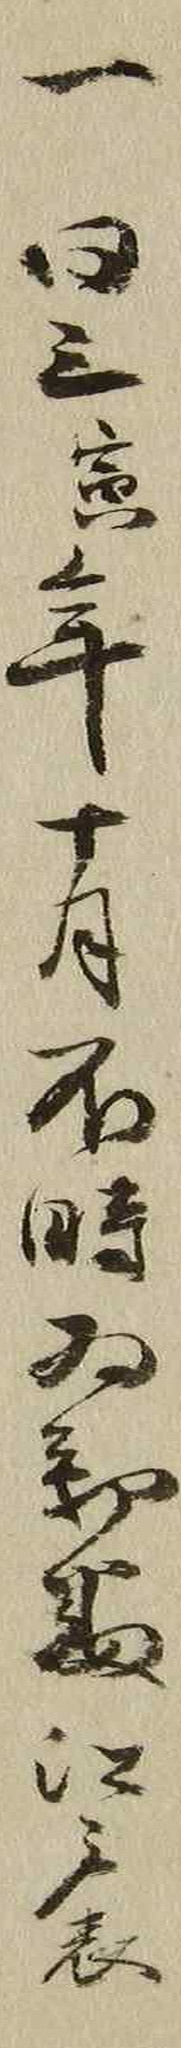一同三寅年十月不時為勤番江戸表
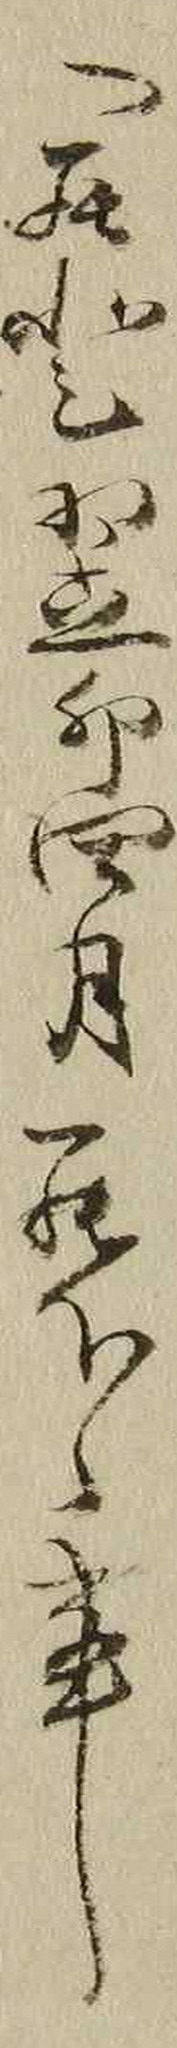へ罷登翌卯四月罷下候事
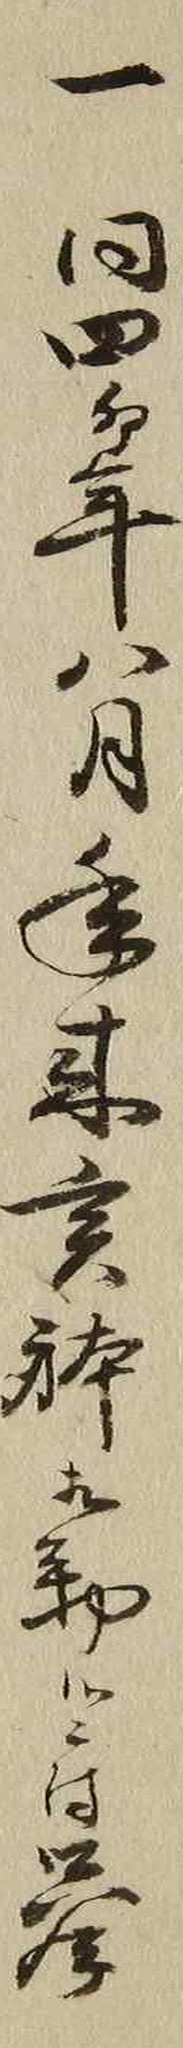一同四卯年八月年来実体相勤候ニ付只今
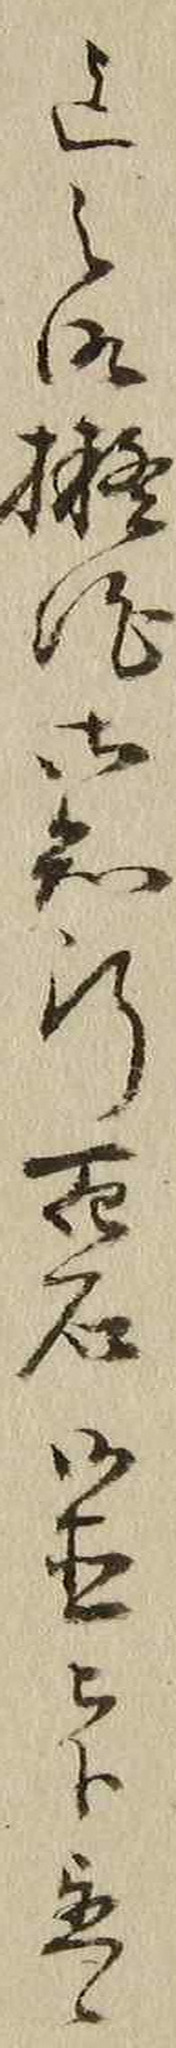迄之御擬作御知行百石御直被下置候
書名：諸士系譜　巻之232　け之部1
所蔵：会津若松市立会津図書館
